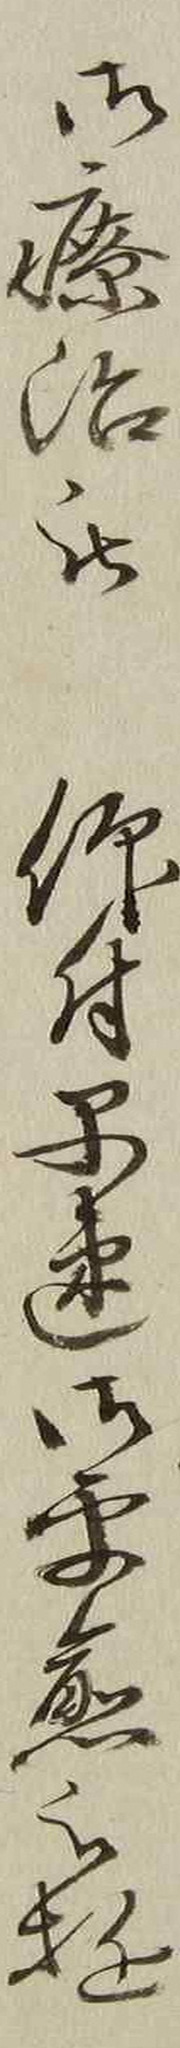御療治被仰付早速御平愈被遊
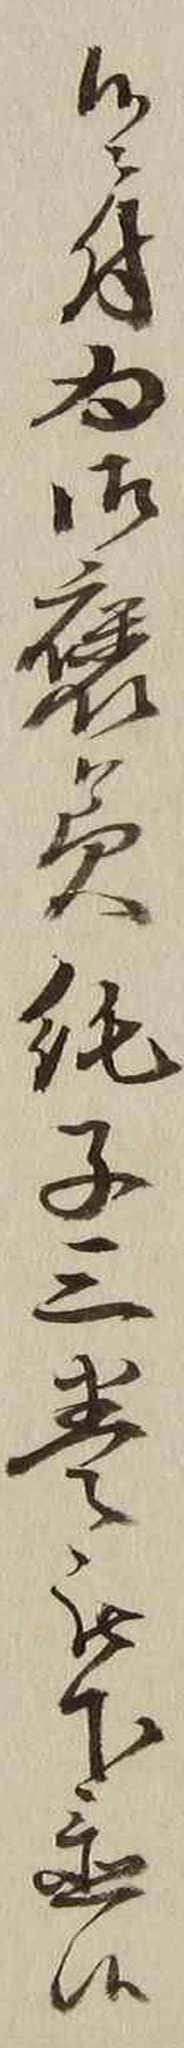候ニ付為御褒美純子三巻被下置候
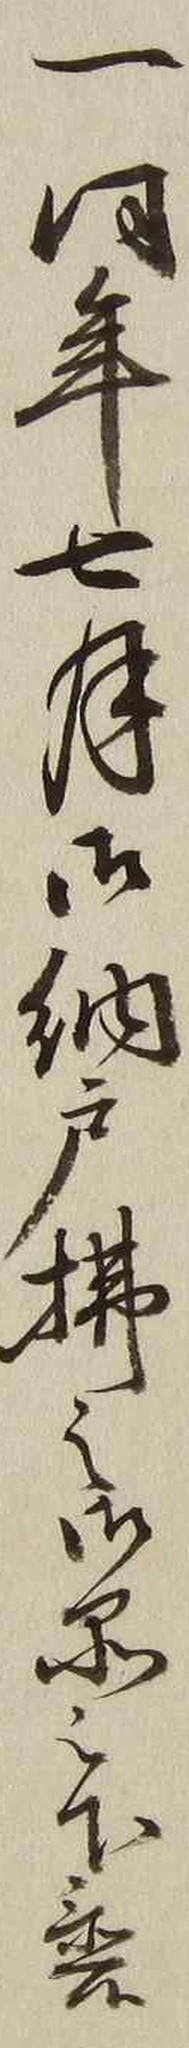一同年七月御納戸払之御品被下置候
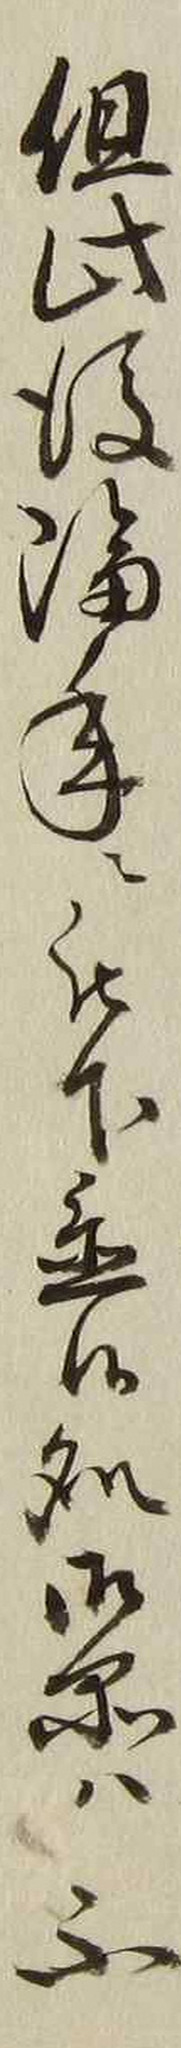但此後隔年ニ被下置候処御品ハ不
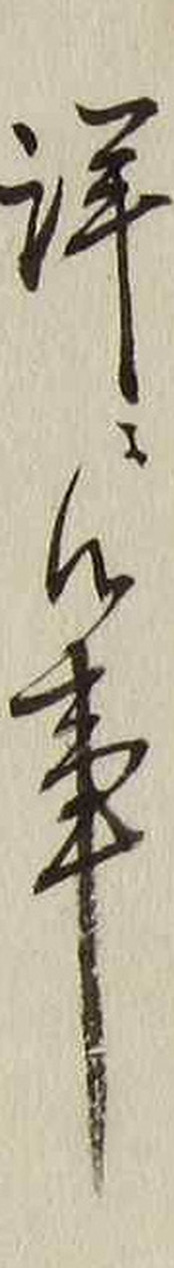詳ニ候事
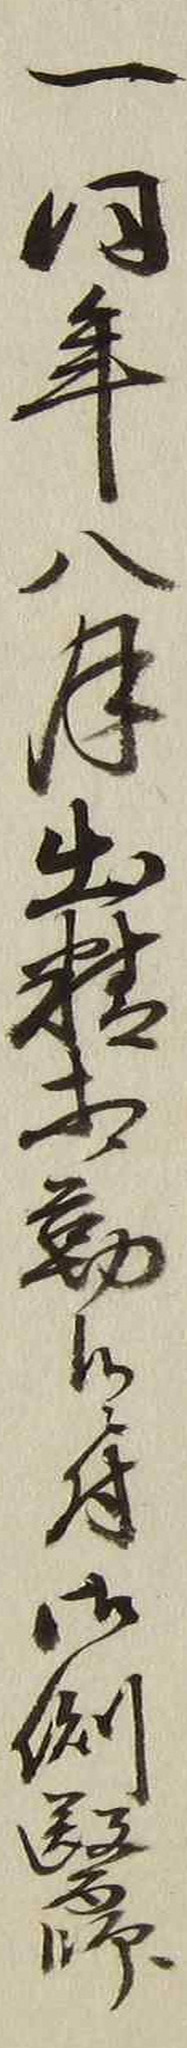一同年八月出精相勤候ニ付御側医師
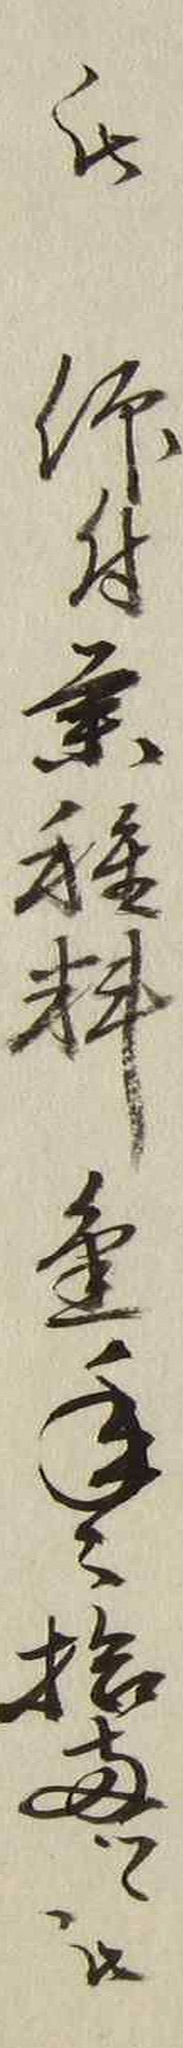被仰付薬種料金年々拾両ツヽ被
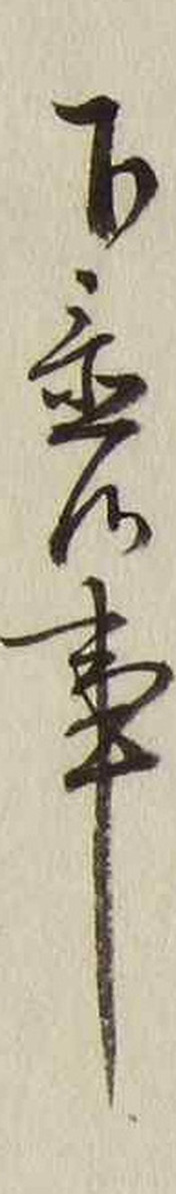下置候事

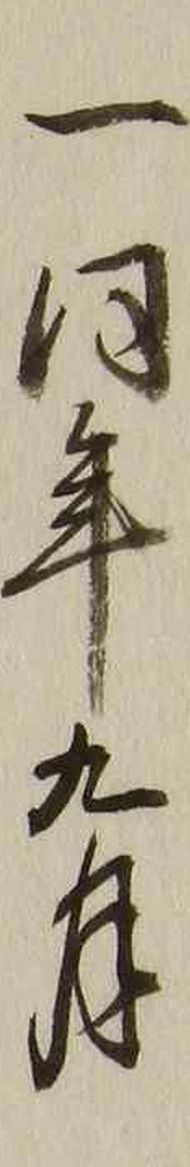一同年八月
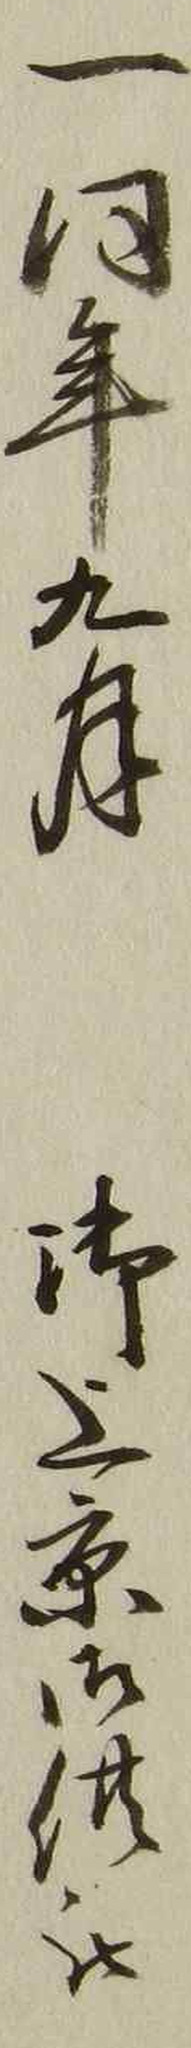一同年九月御上京御供被
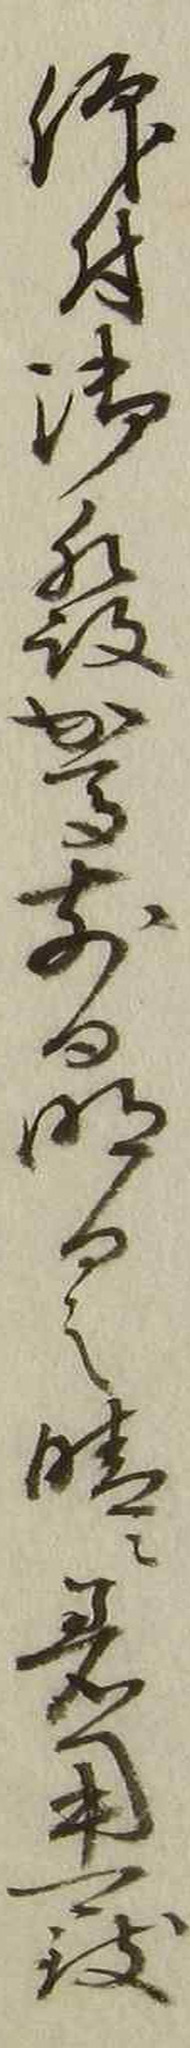仰付御発駕前日明日之晴ニ着用可致
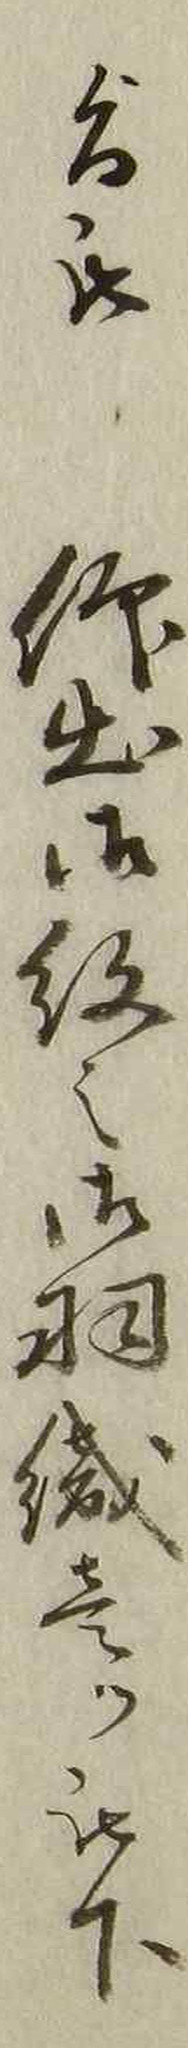旨被仰出御紋之御羽織壱ツ被下
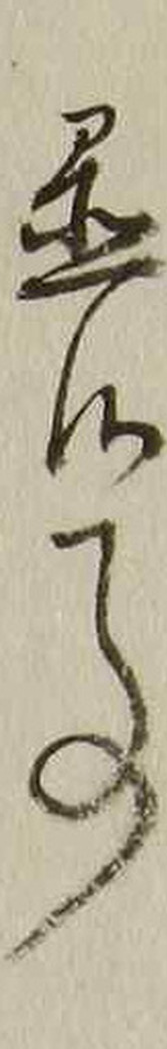置候事
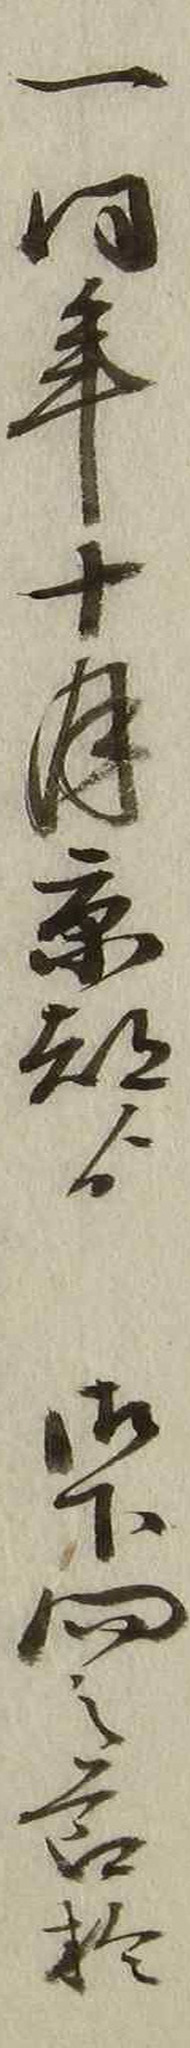一同年十月京都ゟ御下向之節於
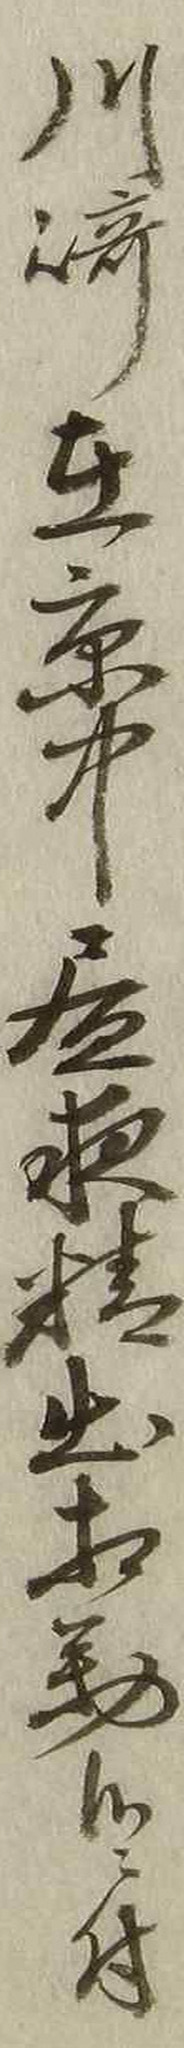川崎在京中昼夜精出相勤候ニ付
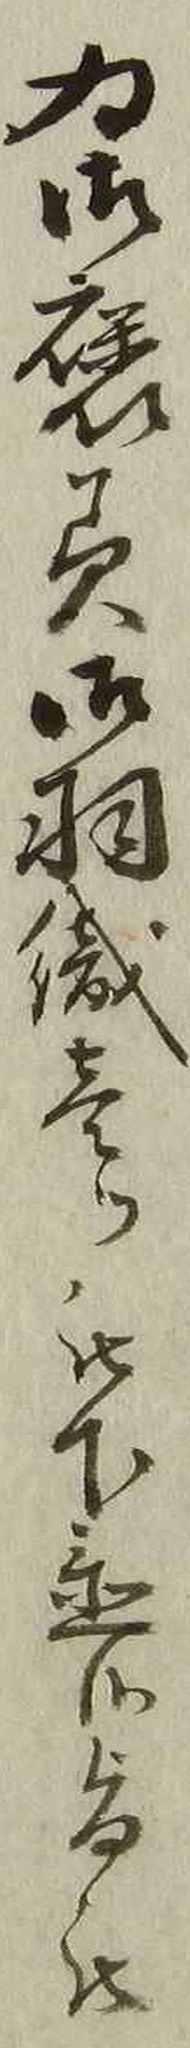為御褒美御羽織壱ツ被下置候旨被
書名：諸士系譜　巻之31　い之部31
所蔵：会津若松市立会津図書館
